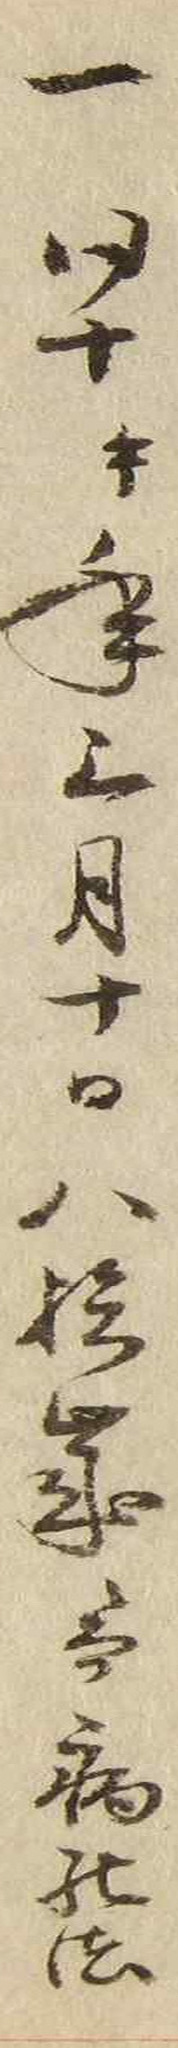一同十午年三月十日八拾歳ニ而病死法

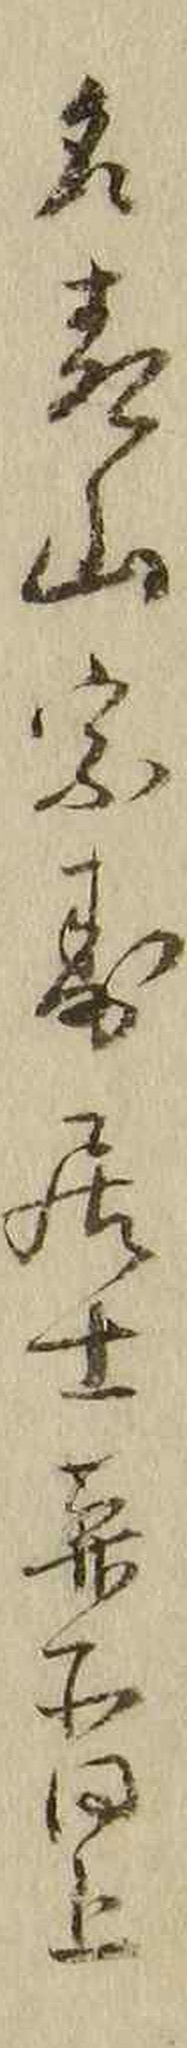名喜山宗寿居士葬所同上
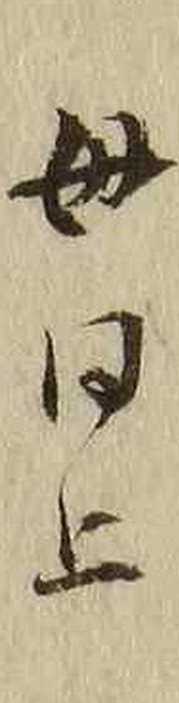母同上
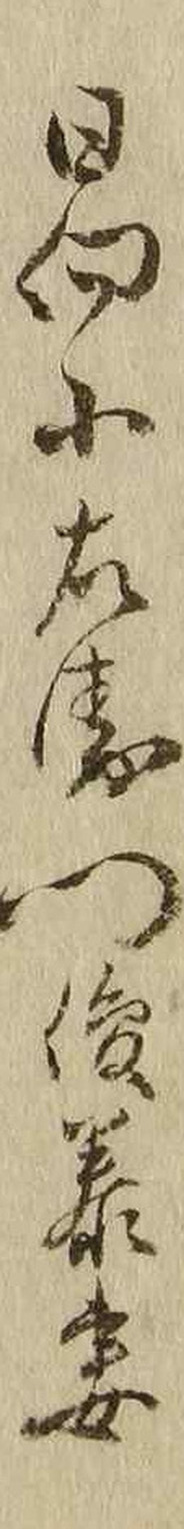女日向小左衛門俊承妻
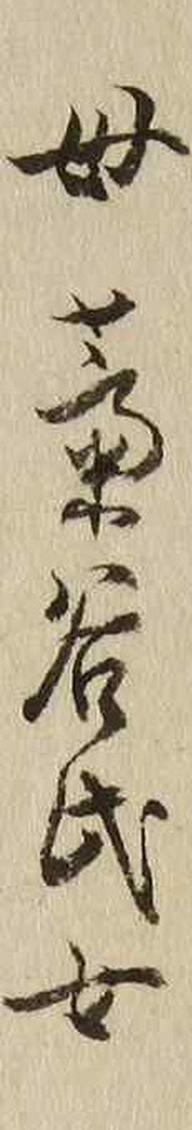母菊谷氏女
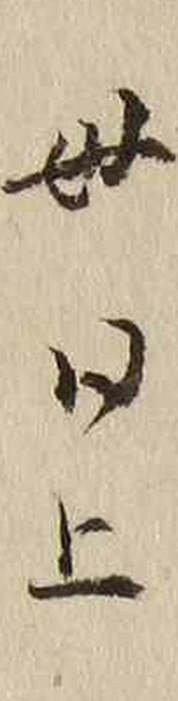母同上

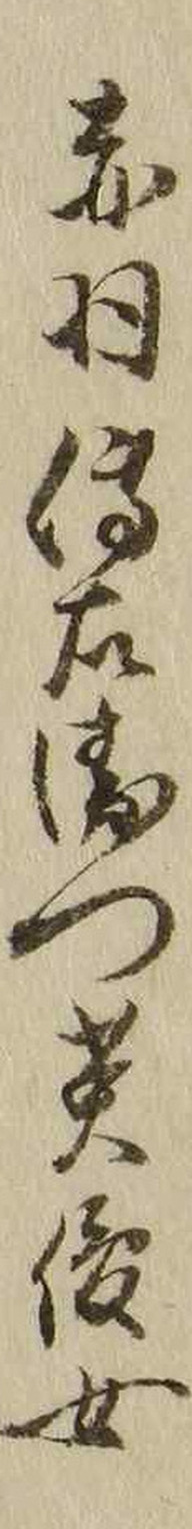赤羽伝右衛門英俊女
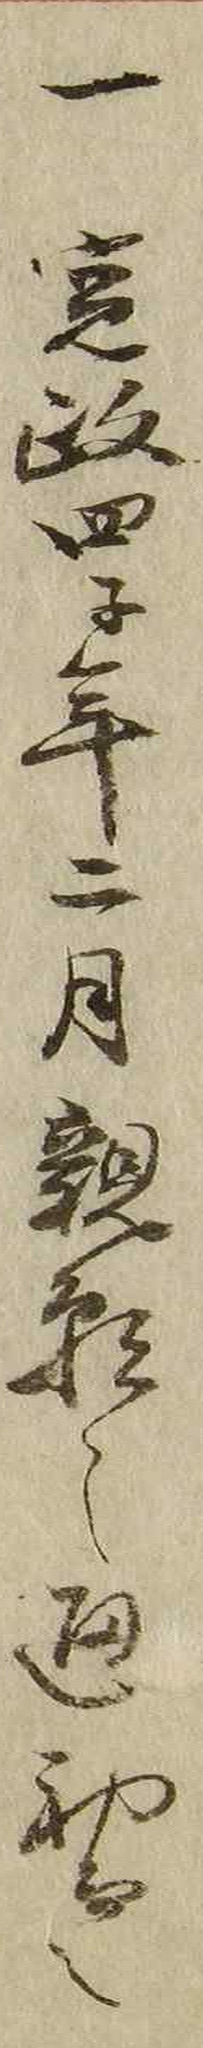一寛政四子年二月親願之通初而之
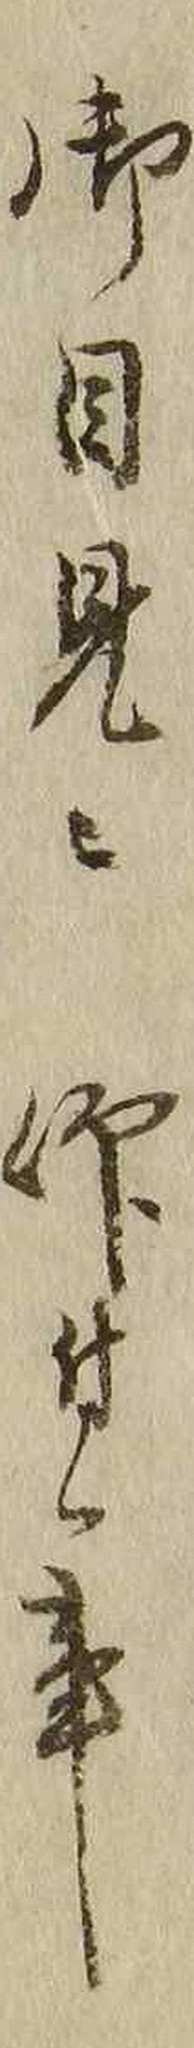御目見被仰付候事
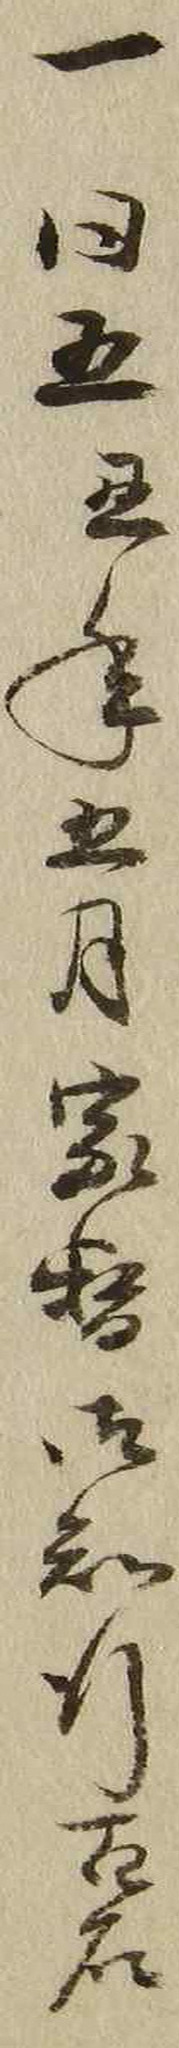一同五丑年五月家督御知行百石
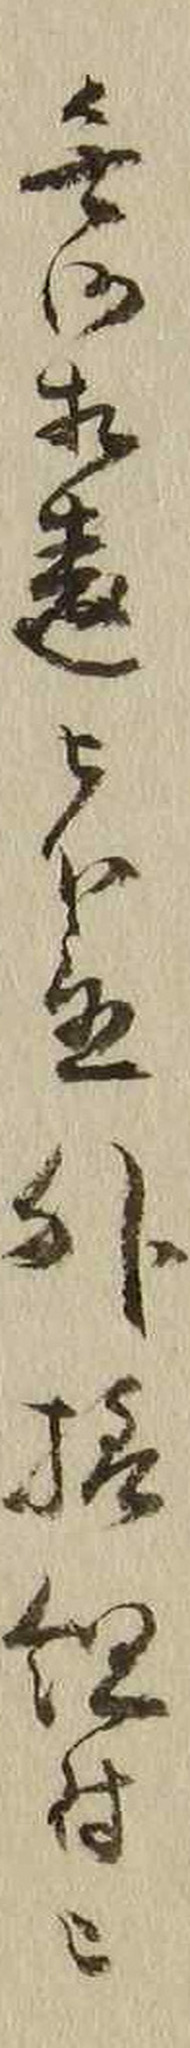無御相違被下置外様組付被
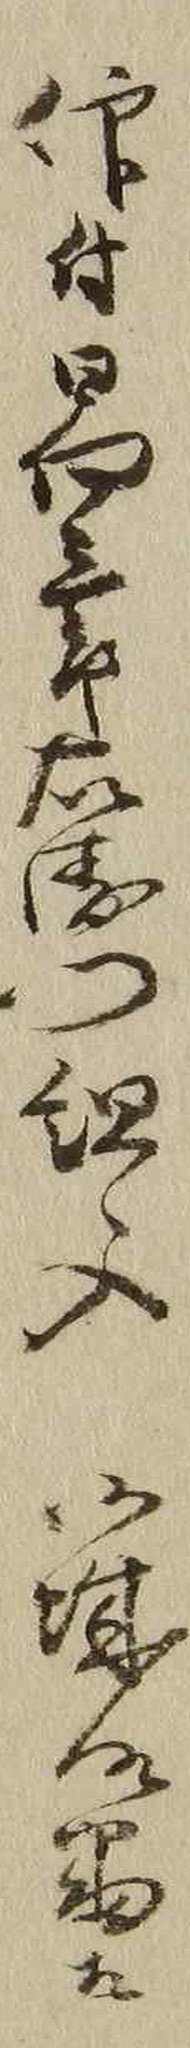仰付日向三郎右衛門組へ御城御番相
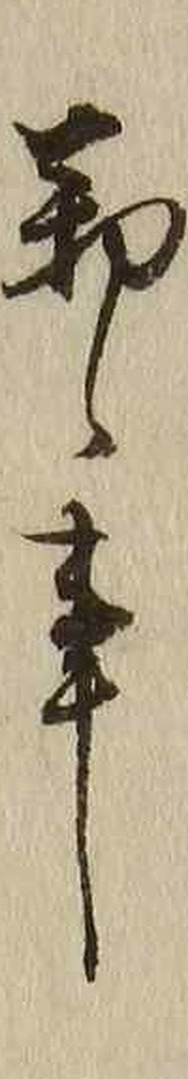勤候事
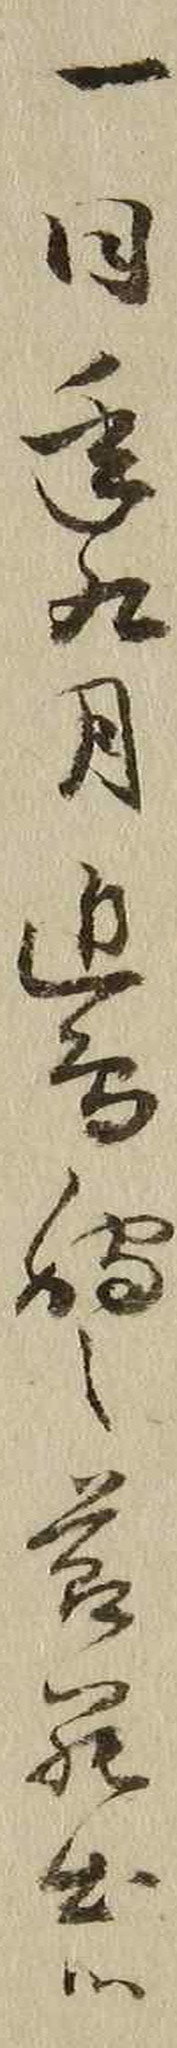一同年九月追鳥狩之節罷出候
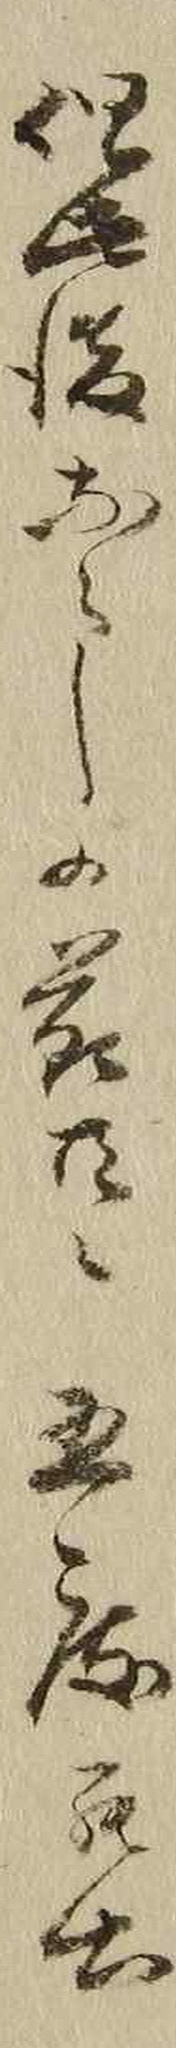但此後ならしの節共ニ五度罷出
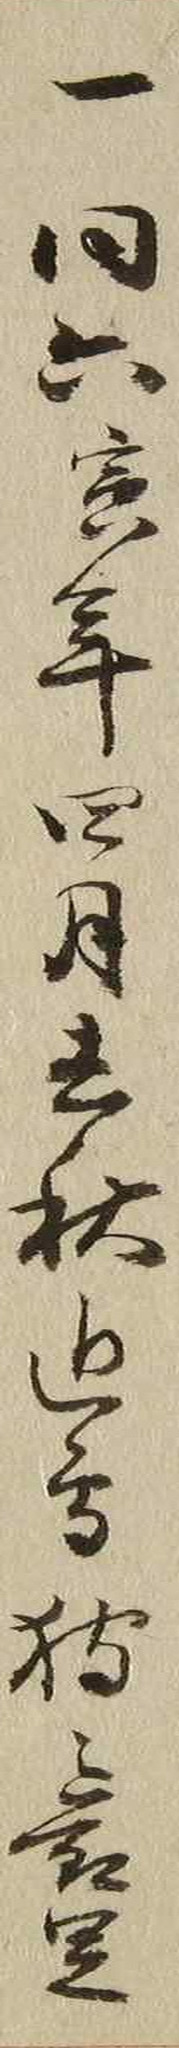一同六寅年四月去秋追鳥狩之節足
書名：諸士系譜　巻之232　け之部1
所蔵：会津若松市立会津図書館
